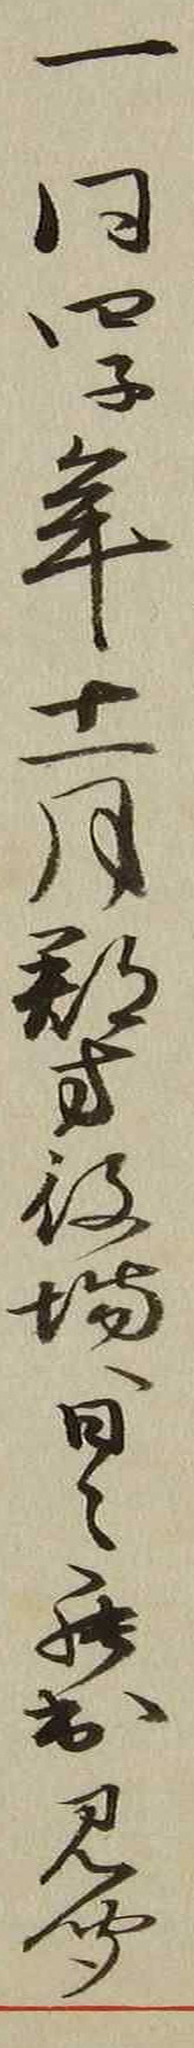一同四子年十一月郡方役場へ日々罷出見聞
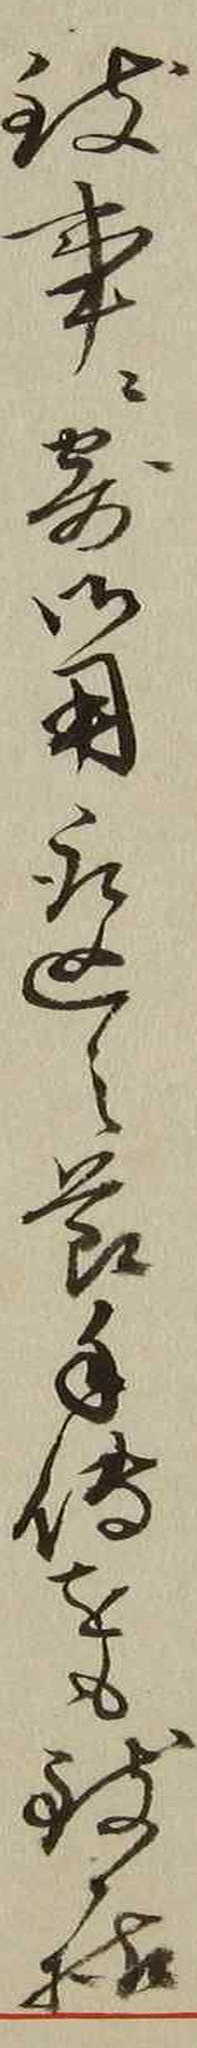致事ニ寄御用取込之節手伝をも致候様
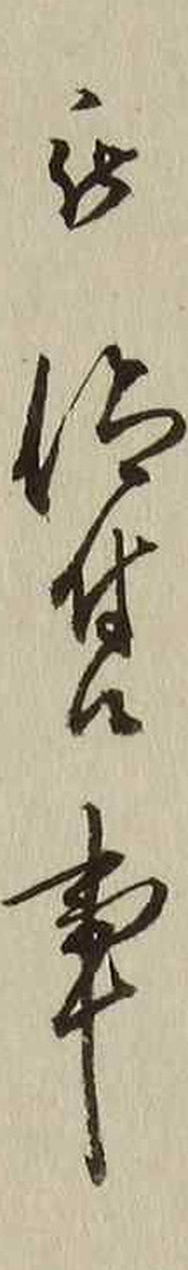被仰付候事
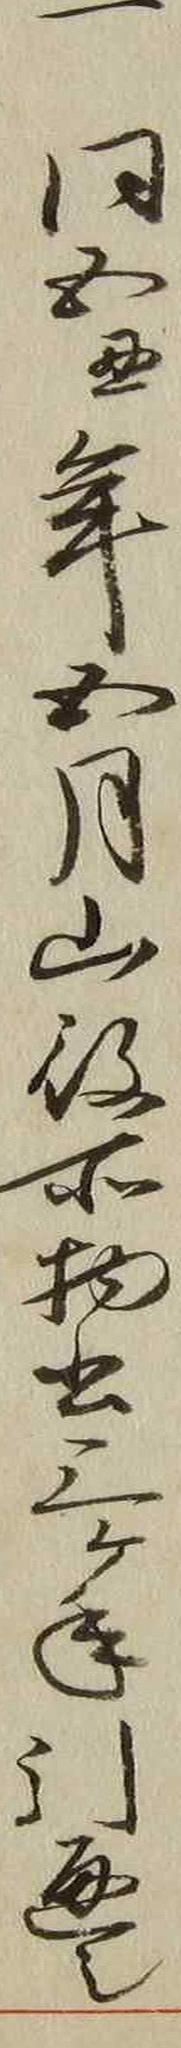一同五丑年五月山役所物書三ヶ年引通し
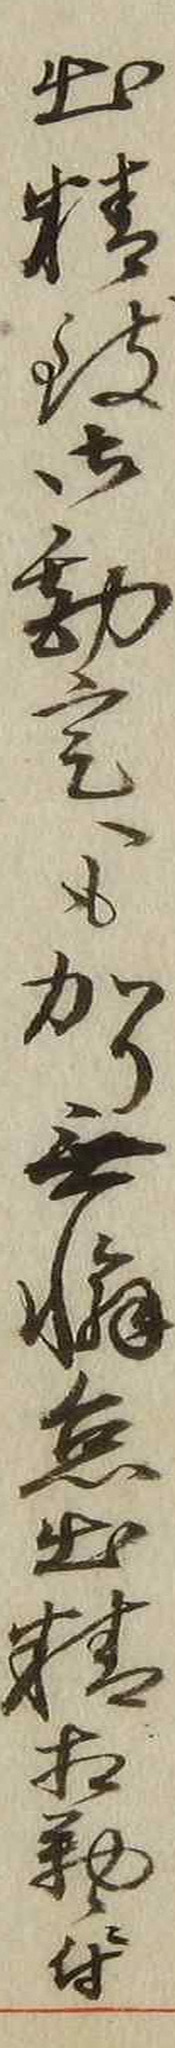出精致御勘定へも加り無懈怠出精相勤候ニ付
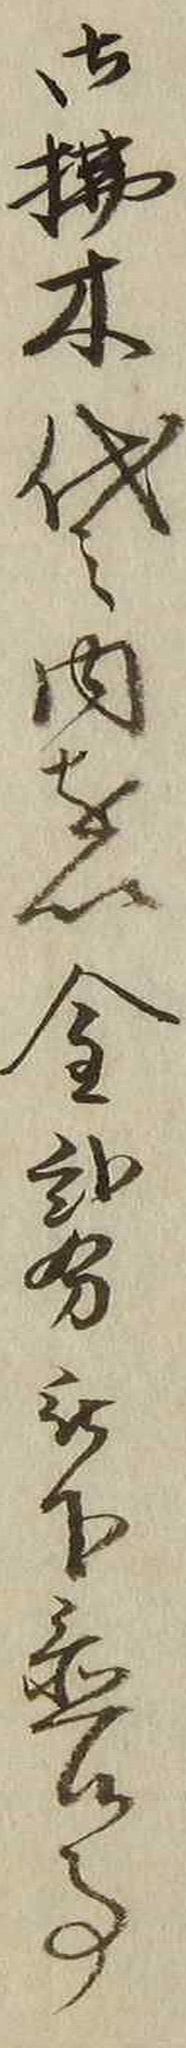御払木伐之内を以金弐分被下置候事
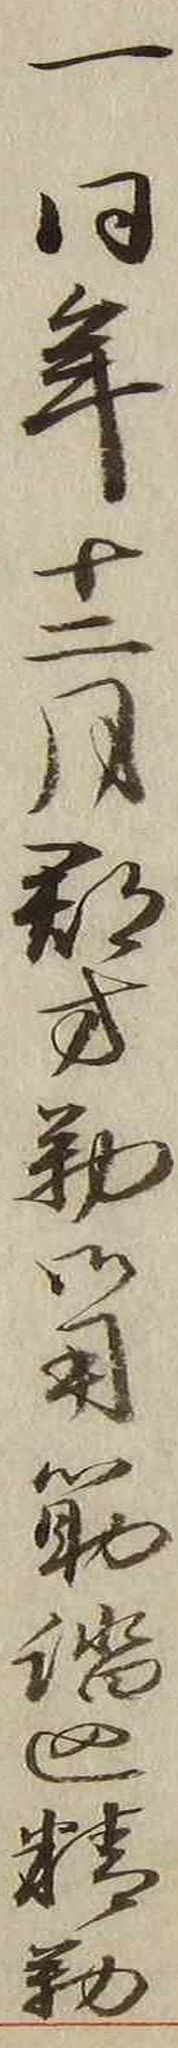一同年十二月郡方勤御用筋踏込精勤
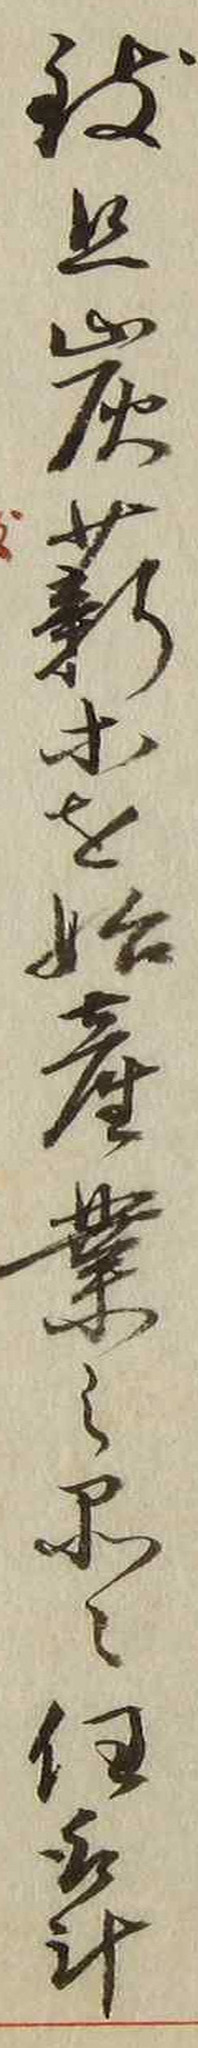致且炭薪等を始産業之品々任取計
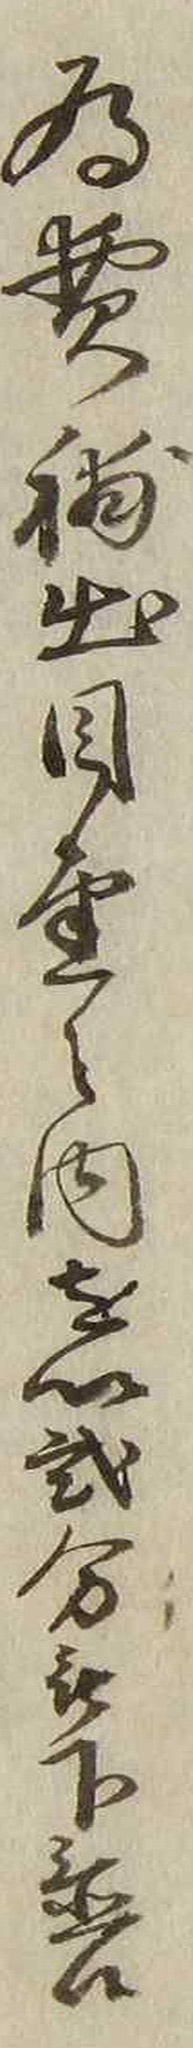為費補出目金之内を以弐分被下置候
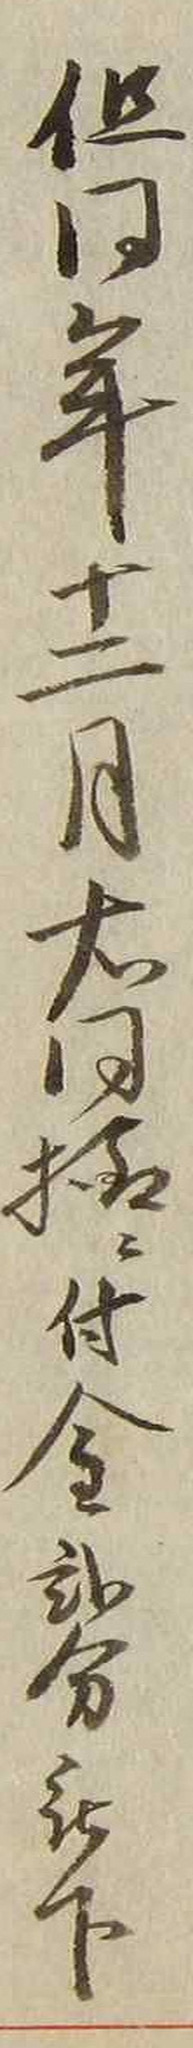但同年十二月右同様ニ付金弐分被下
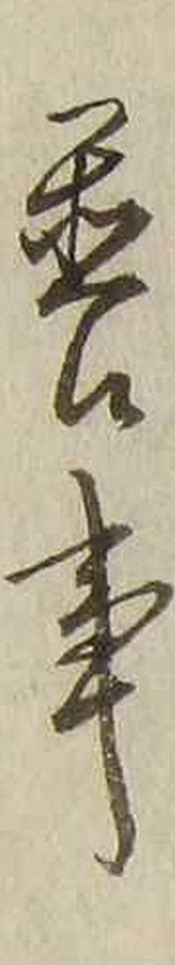置候事

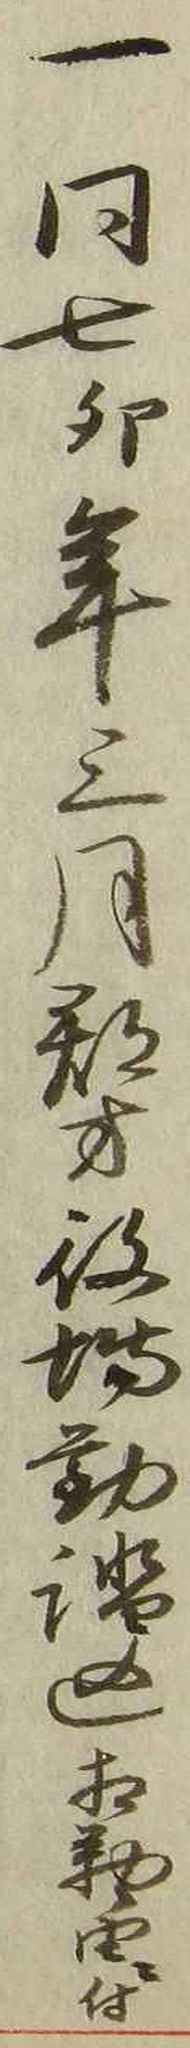一同七卯年三月郡方役場勤踏込相勤候由ニ付
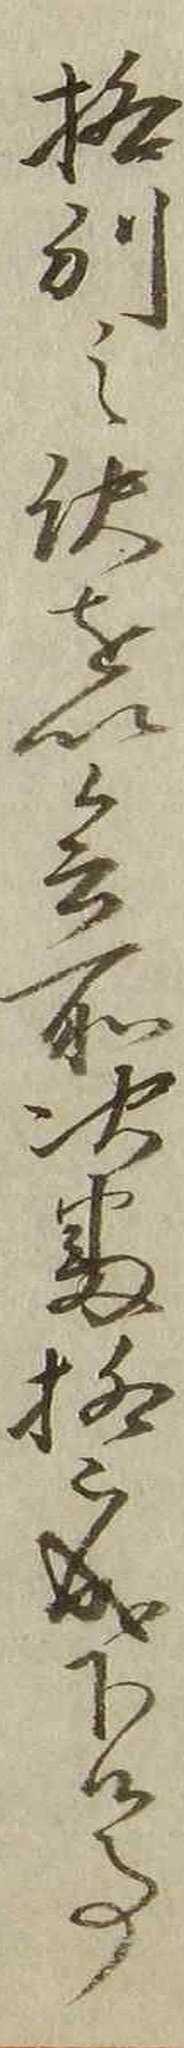格別之訳を以会所次番格被成下候事
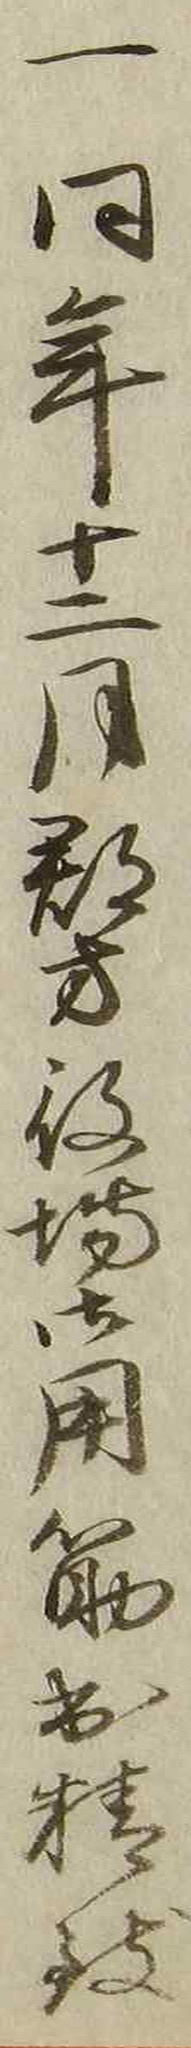一同年十二月郡方役場御用筋出精致
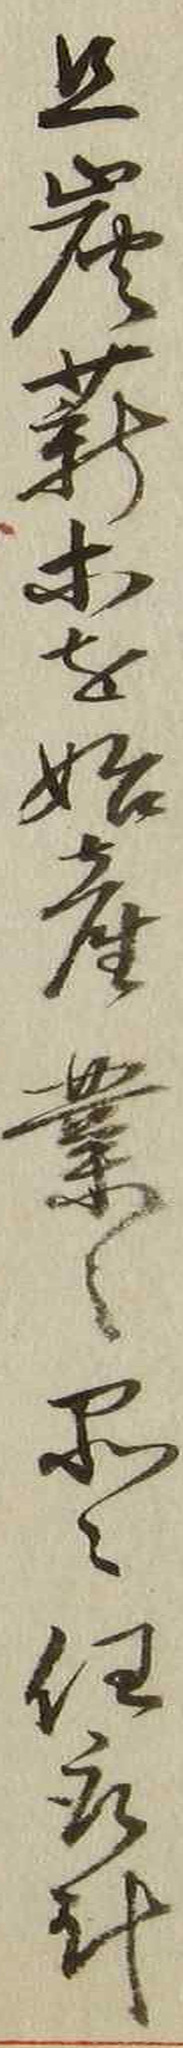且炭薪等を始産業之品々任取計
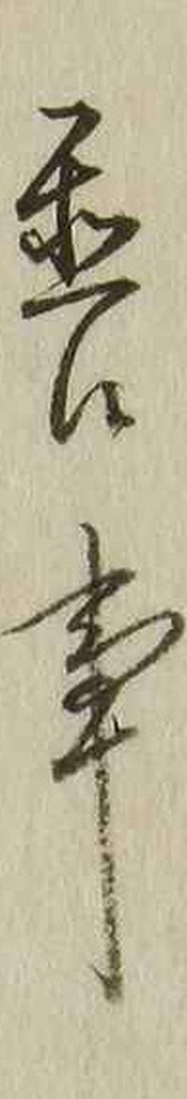置候事
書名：諸士系譜　巻之102　か之部10
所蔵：会津若松市立会津図書館
